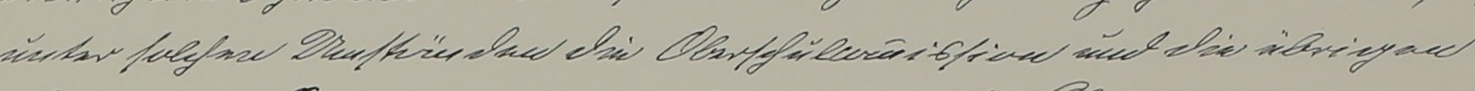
unter solchen Umständen die Oberschulcommission und die übrigen
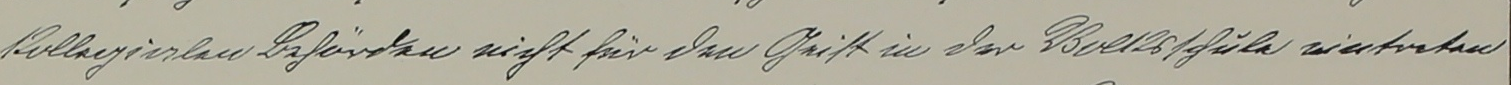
kollegialen Behörden nicht für den Geist in der Volksschule eintreten
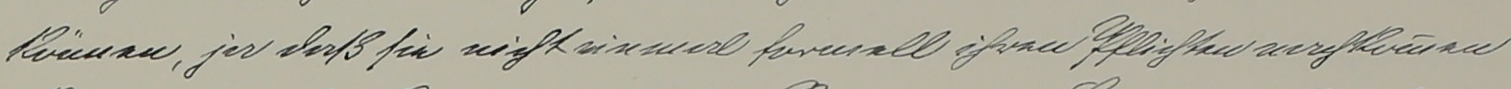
können, ja daß sie nicht einmal formell ihren Pflichten nachkommen
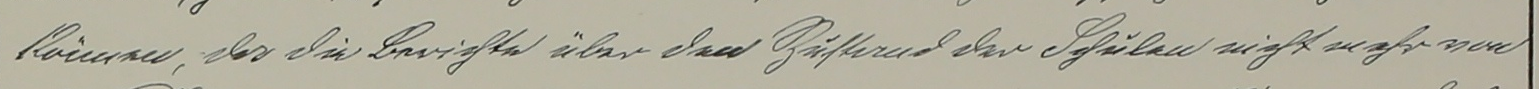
können, da die Berichte über den Zustand der Schulen nicht mehr von
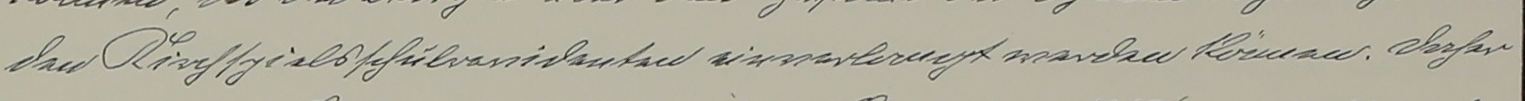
den Kirchspielsschulrevidenten einverlangt werden können. Daher
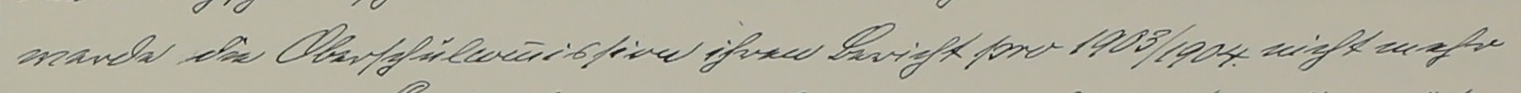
werde die Oberschulcommission ihren Bericht pro 1903/1904. nicht mehr
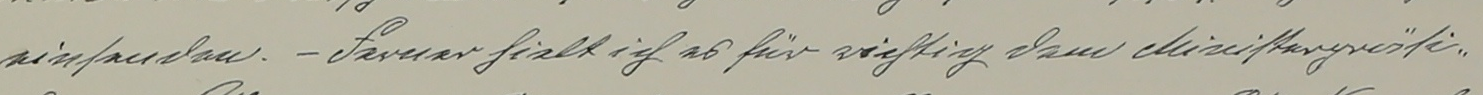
einsenden. – Ferner hielt ich es für richtig dem Ministerpräsi-
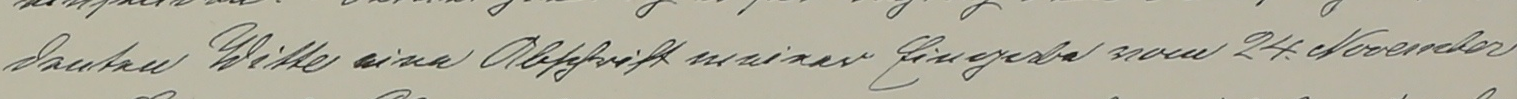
denten Witte eine Abschrift meiner Eingabe vom 24. November
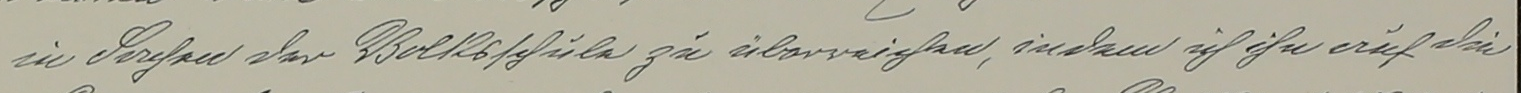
in Sachen der Volksschule zu überreichen, indem ich ihn auf die
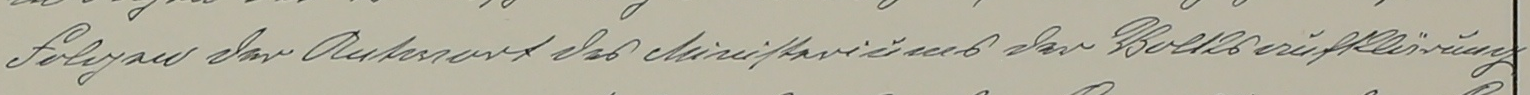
Folgen der Antwort des Ministeriums der Volksaufklärung
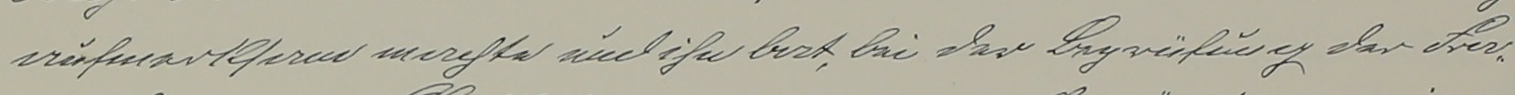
aufmerksam machte und ihn bat, bei der Beprüfung der Fra-
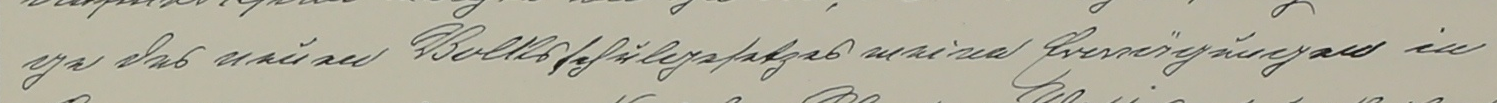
ge des neuen Volksschulgesetzes meine Erwägungen in
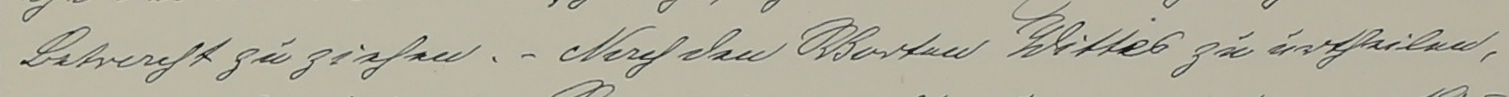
Betracht zu ziehen. – Nach den Worten Wittes zu urtheilen,
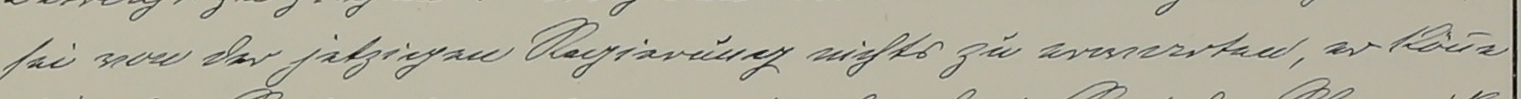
sei von der jetzigen Regierung nichts zu erwarten, er könne
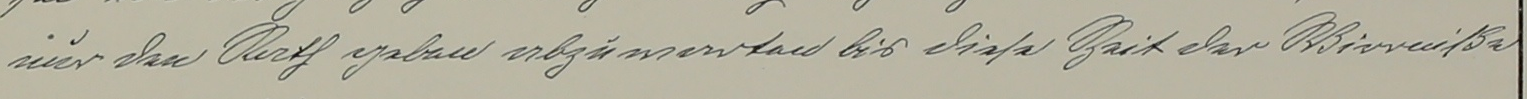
nur den Rath geben abzuwarten bis diese Zeit der Wirrniße
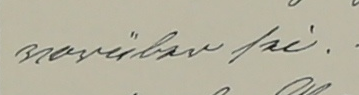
vorüber sei.
